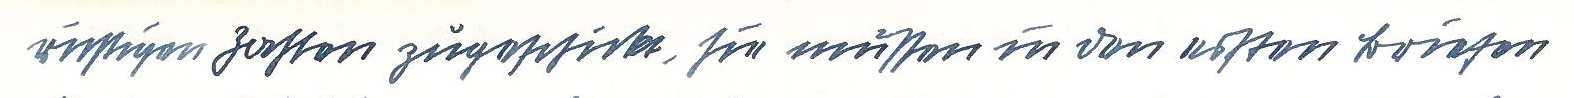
richtigen Zahlen zugeschickt, sie müssen in den ersten Briefen
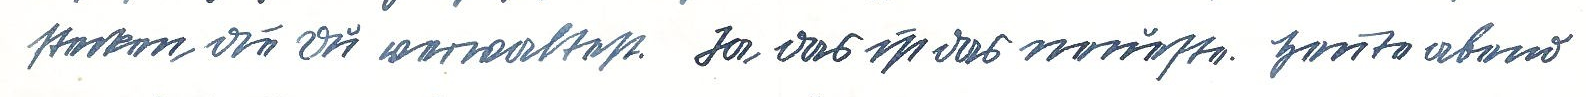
stecken, die Du verwaltest. Ja, das ist das neueste. Heute abend
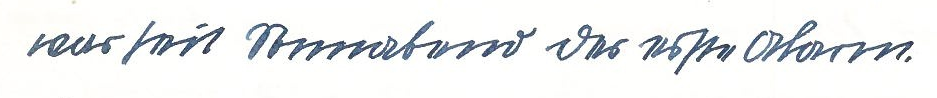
war seit Sonnabend der erste Alarm.
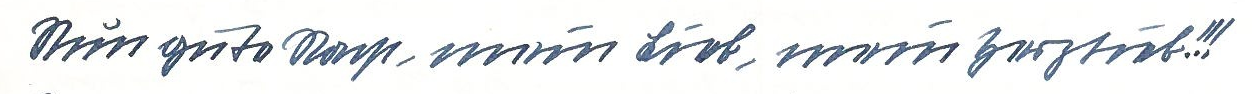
Nun gute Nacht, mein Lieb, mein Herzlieb!!!
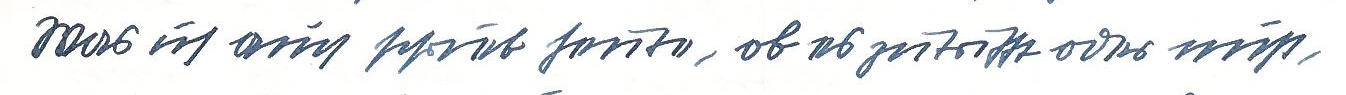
Was ich auch schrieb heute, ob es zutrifft oder nicht,
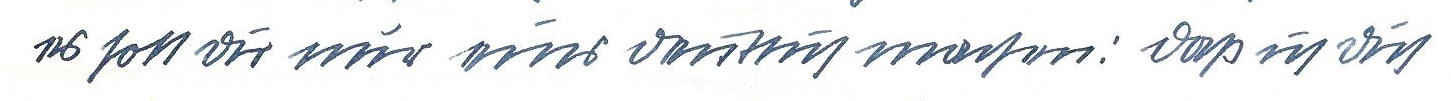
es soll Dir nur eins deutlich machen: daß ich Dich
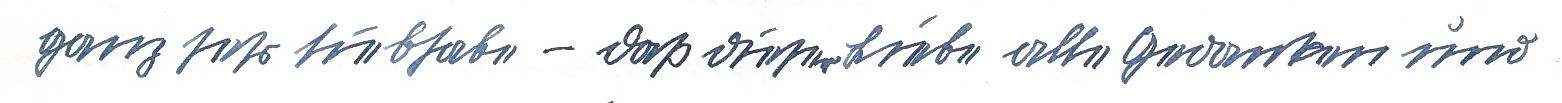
ganz sehr liebhabe – daß dieser Liebe alle Gedanken und
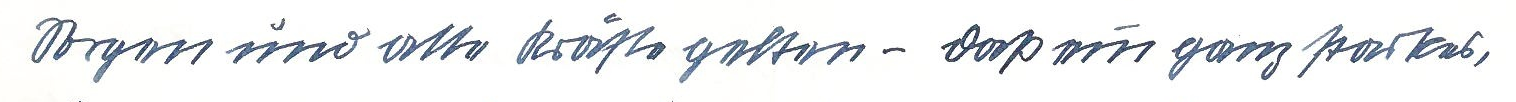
Sorgen und alle Kräfte gelten – daß ein ganz starkes,
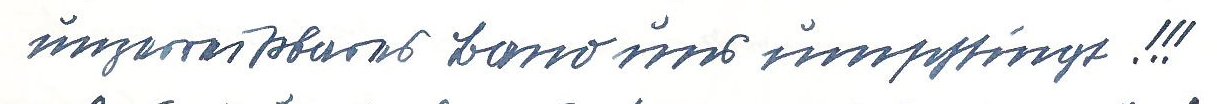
unzerreißbares Band uns umschlingt!!!
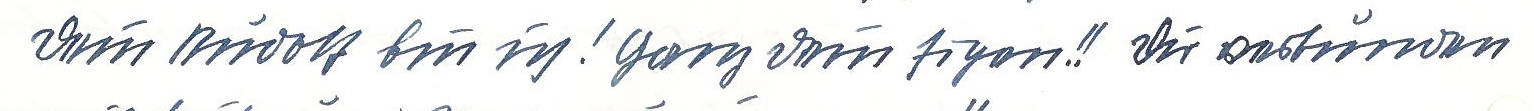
Dein bin ich! Ganz Dein Eigen!! Dir verbunden
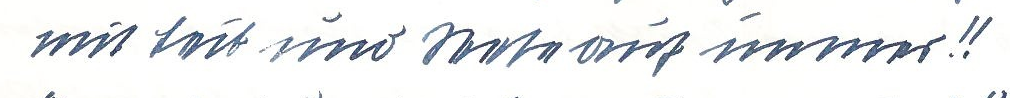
mit Leib und Seele auf immer!!
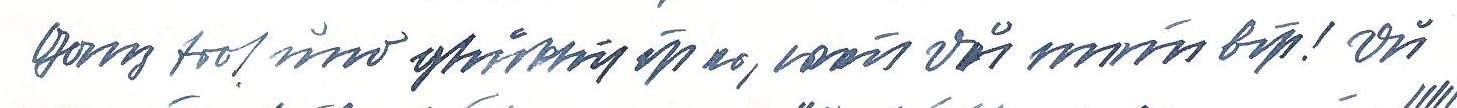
Ganz froh und glücklich ist er, weil Du mein bist! Du
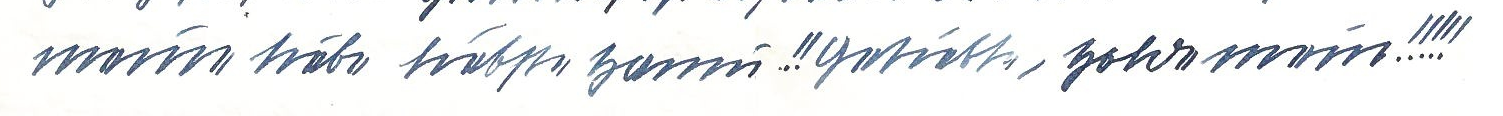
meine liebe liebste !! Geliebte, Holde mein!!!!!
